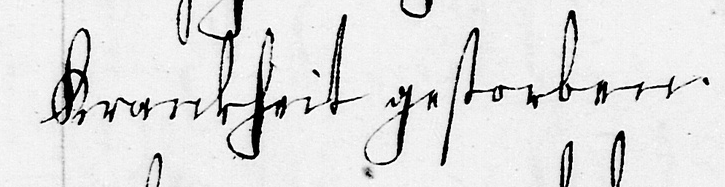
Krankheit gestorben.
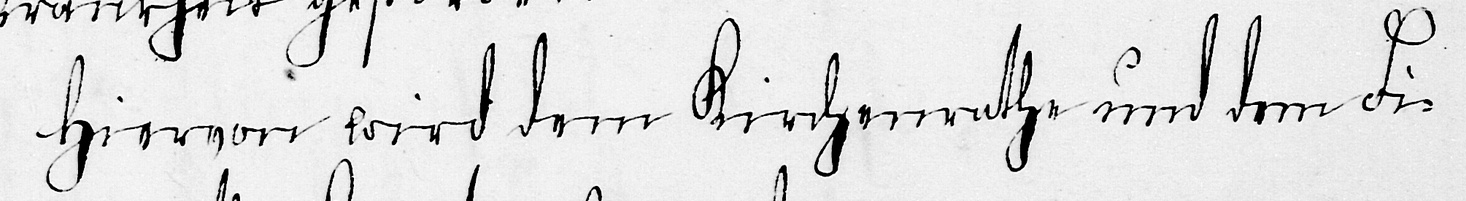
Hiervon wird dem Kirchenrathe und dem Fi¬
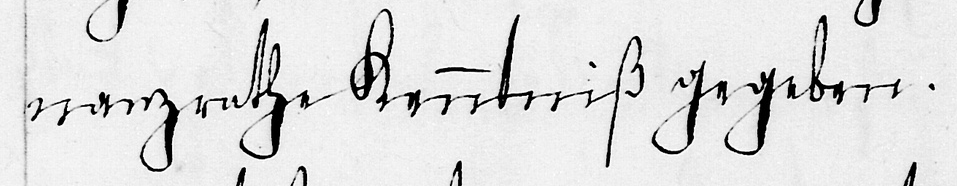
nanzrathe Kenntniß gegeben.
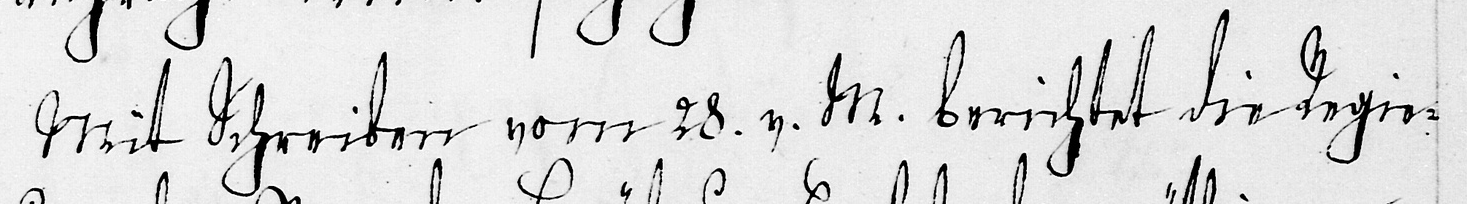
Mit Schreiben vom 28. v. M. berichtet die Regie¬
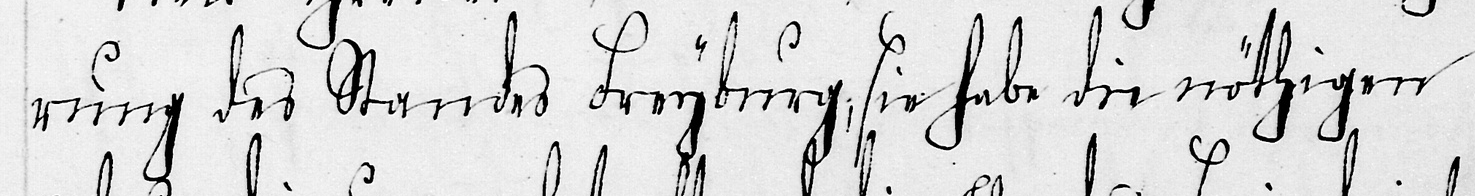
rung des Standes Freyburg, sie habe die nöthigen
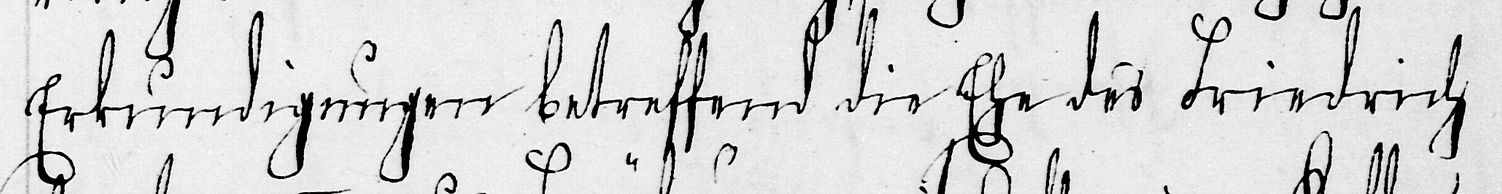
Erkundigungen betreffend die Ehe des Friedrich
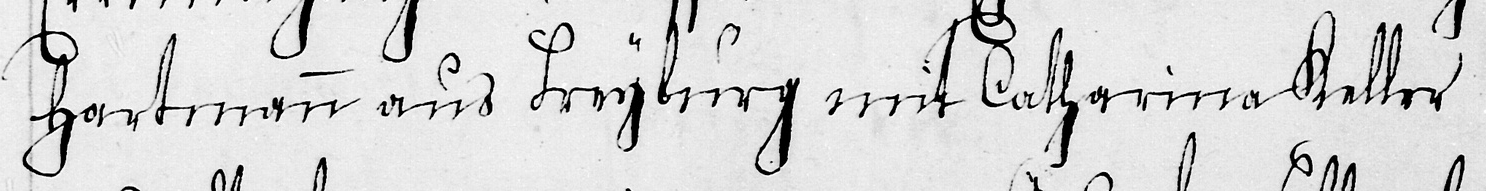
Hartmann aus Freyburg mit Catharina Keller
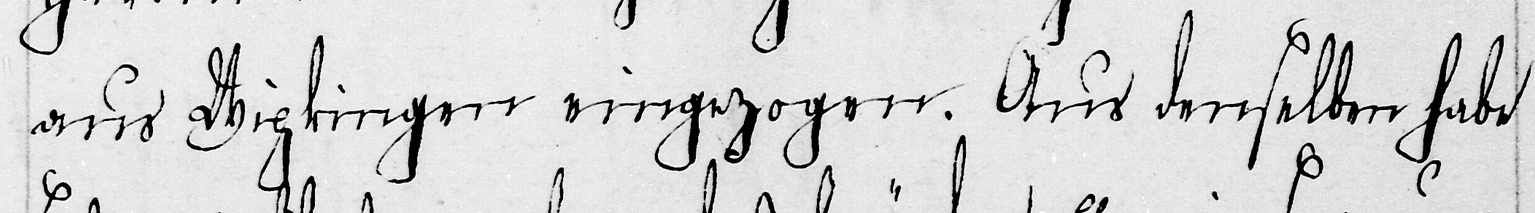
aus Wipkingen eingezogen. Aus denselben habe
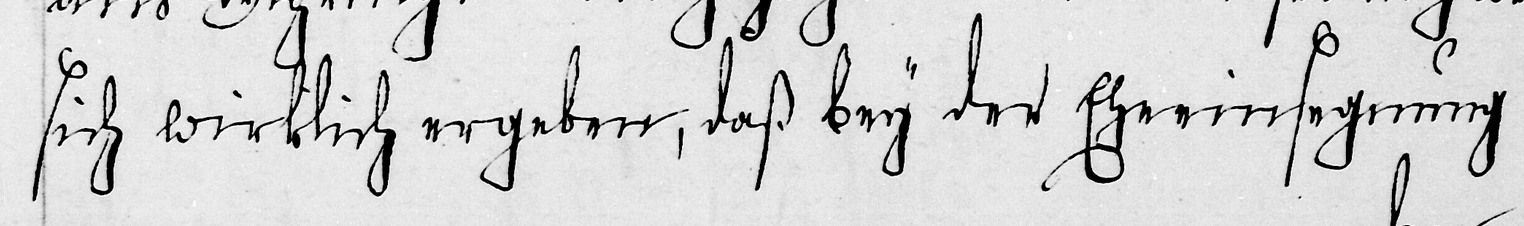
sich wirklich ergeben, daß bey der Eheeinsegnung
